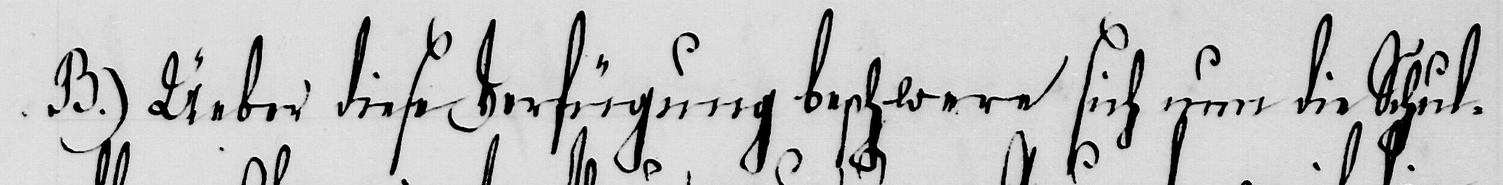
B.) Über diese Verfügung beschwere sich nun die Schul¬
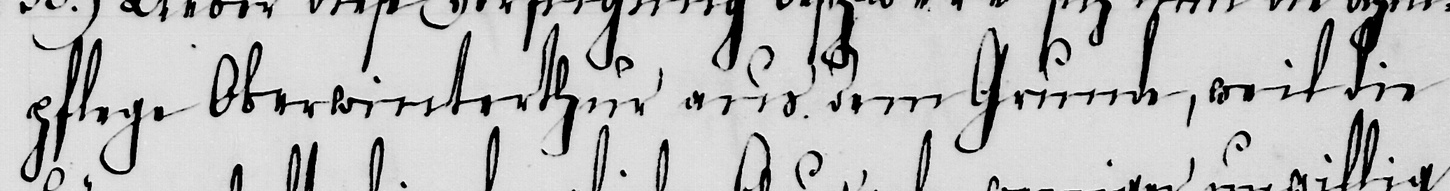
pflege Oberwinterthur aus dem Grunde, weil die
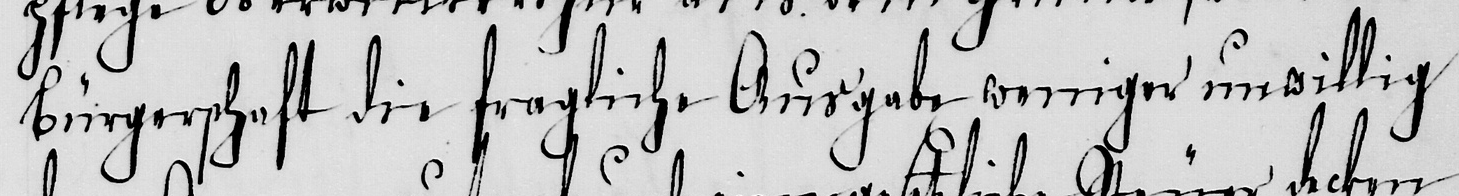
Bürgerschaft die fragliche Ausgabe weniger unwillig
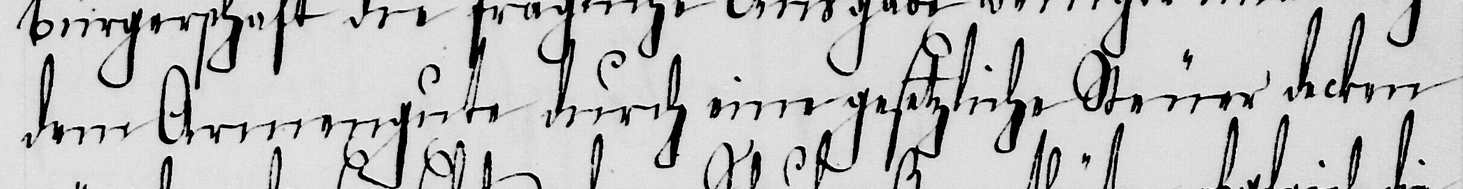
dem Armengute durch eine gesetzliche Steuer decken
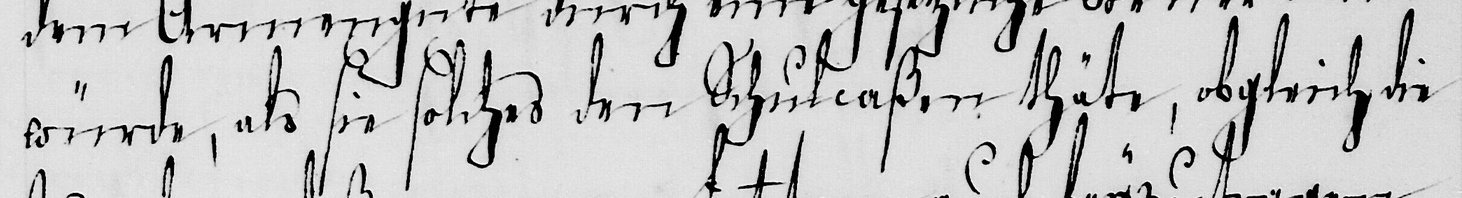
würde, als sie solches den Schulcaßen thäte, obgleich die
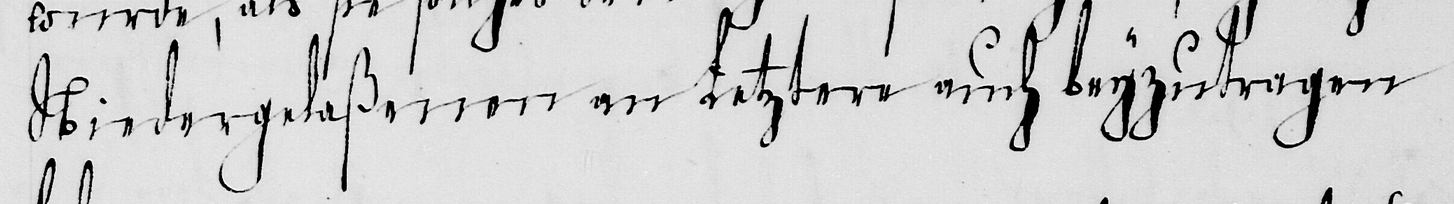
Niedergelaßenen an Letztere auch beyzutragen
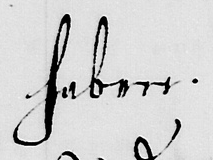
haben.
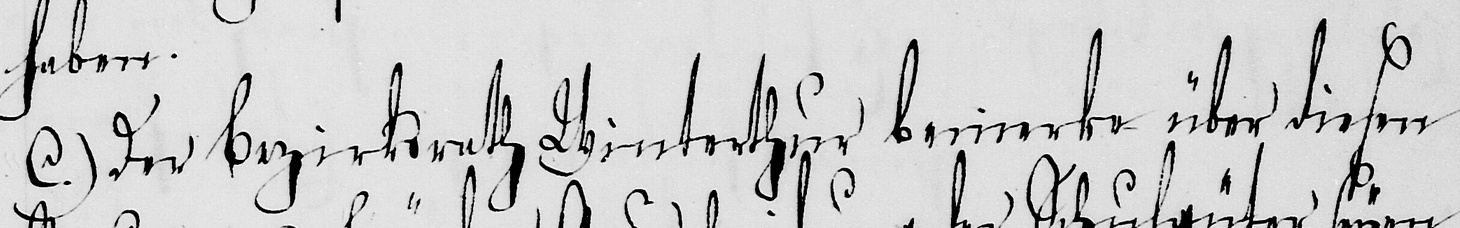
C.) Der Bezirksrath Winterthur bemerke über diesen
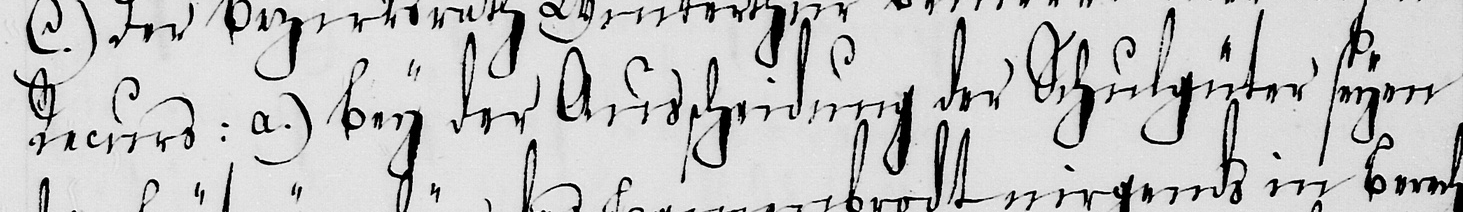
Recurs: a.) bey der Ausscheidung der Schulgüter seyen
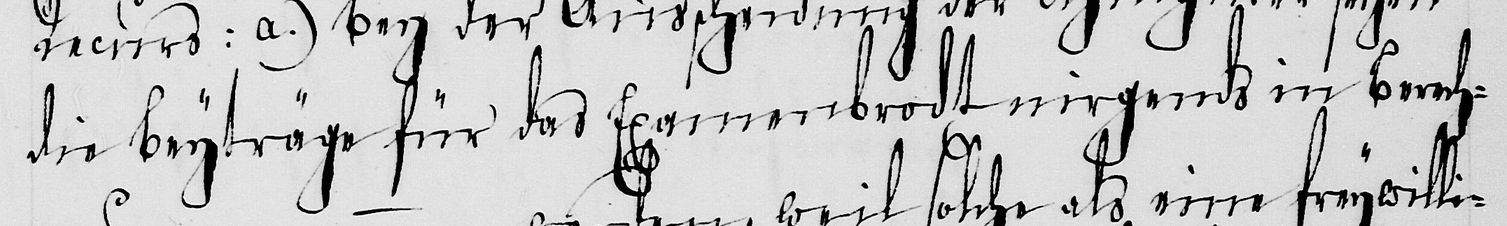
die Beyträge für das Examenbrodt nirgends in Berech¬
